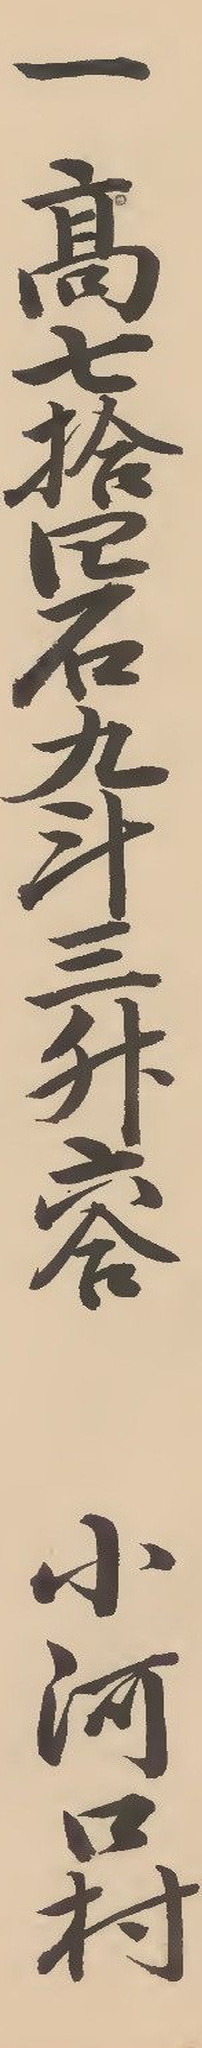一高七拾四石九斗三升六合小河口村
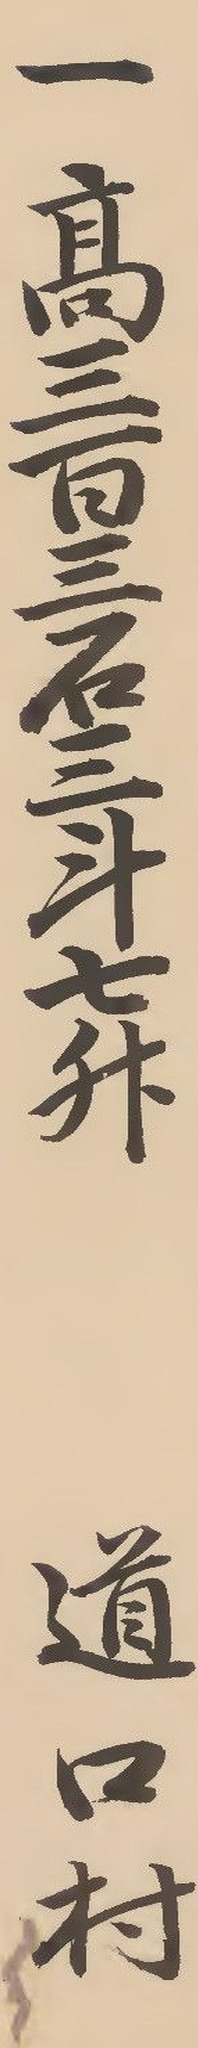一高三百三石三斗七升道口村
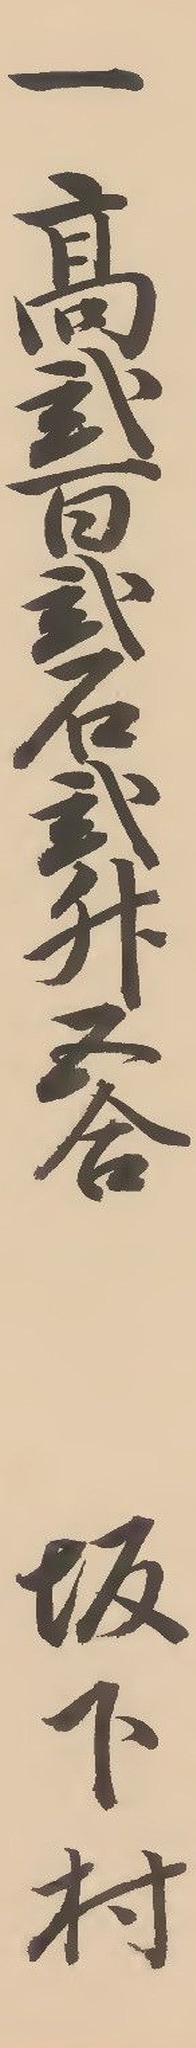一高弐百弐石弐升五合坂下村
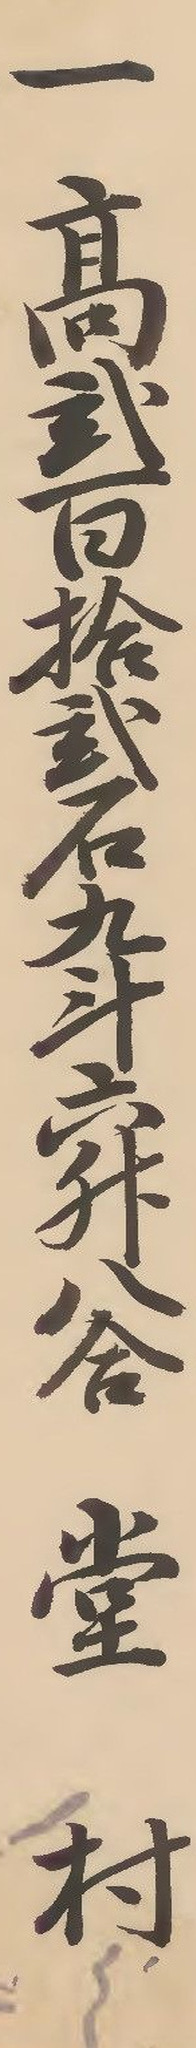一高弐百拾弐石九斗六升八合堂村

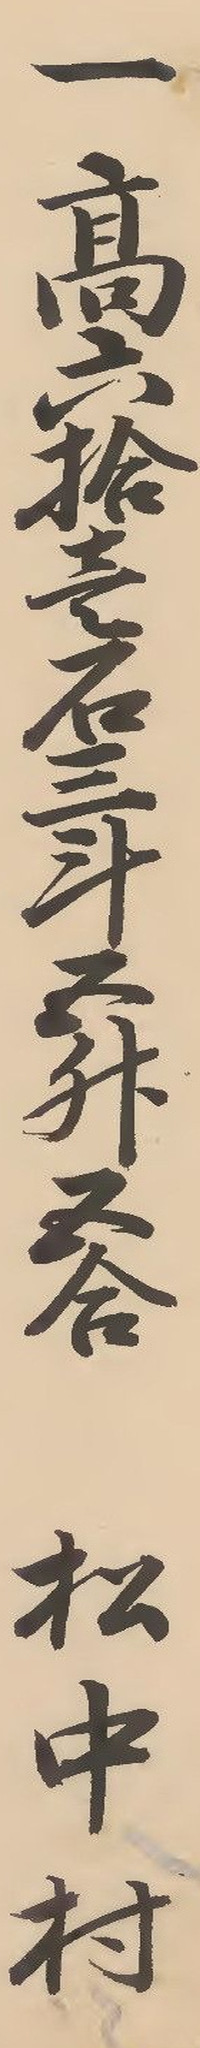一高六拾壱石三斗五升五合松中村
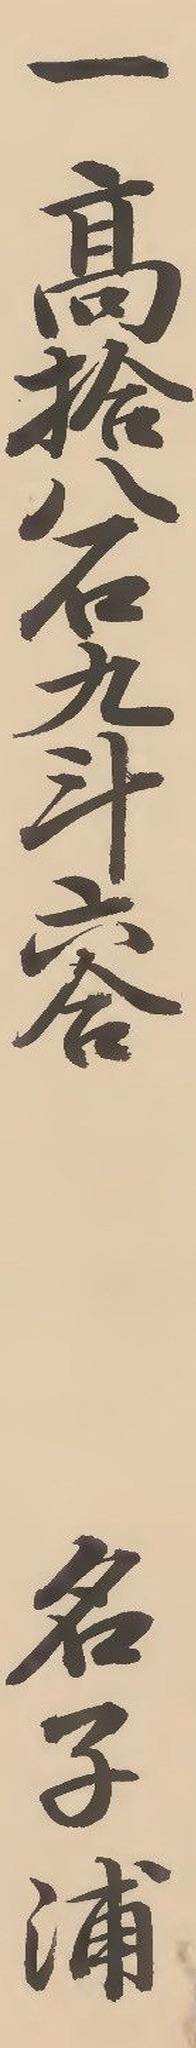一高拾八石九斗六合名子浦
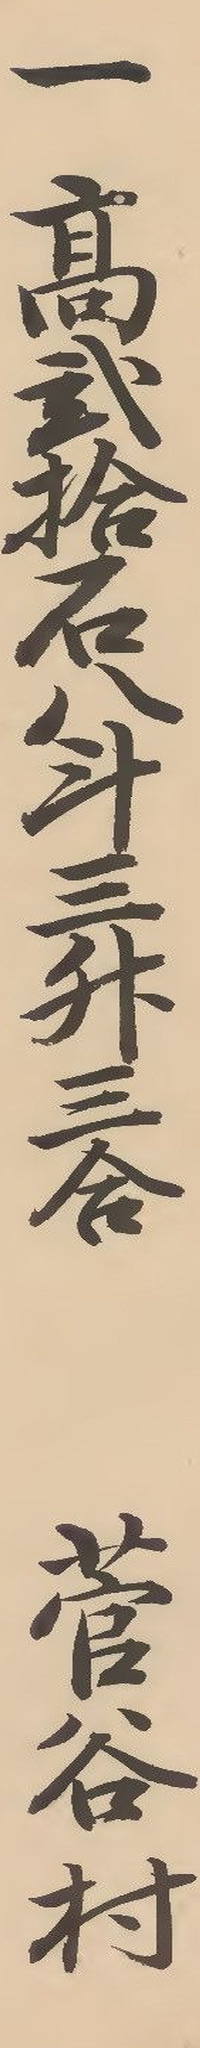一高弐拾石八斗三升三合菅谷村
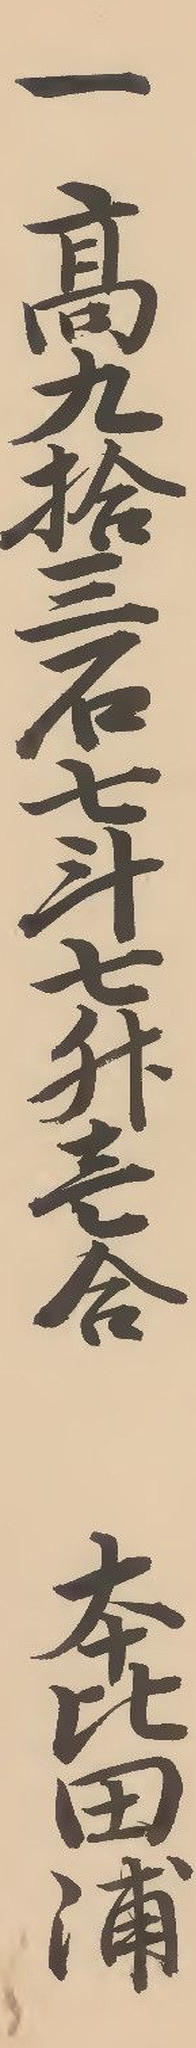一高九拾三石七斗七升壱合本比田浦
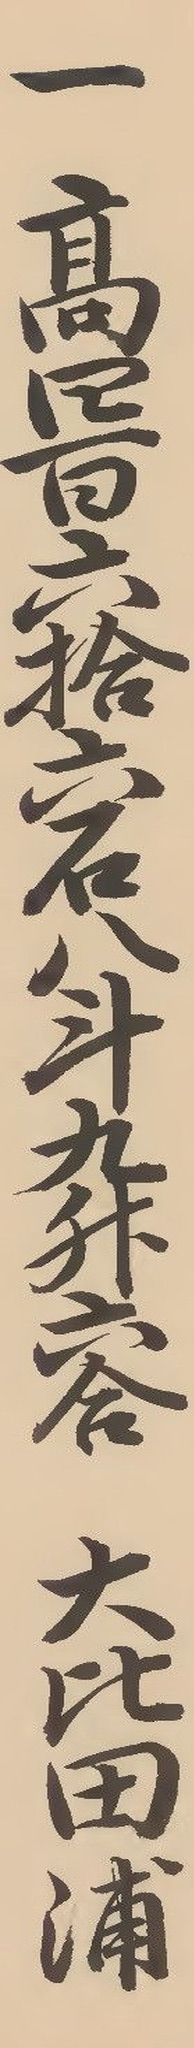一高四百六拾六石八斗九升六合大比田浦
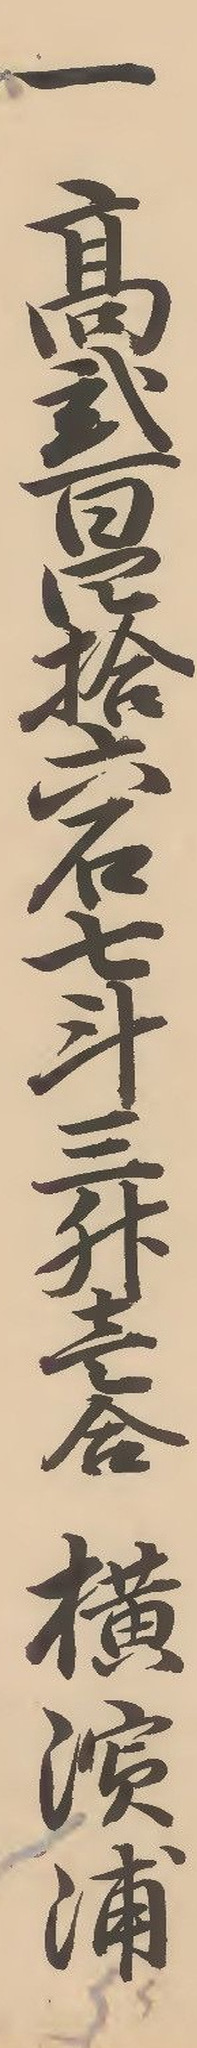一高弐百四拾六石七斗三升壱合横浜浦

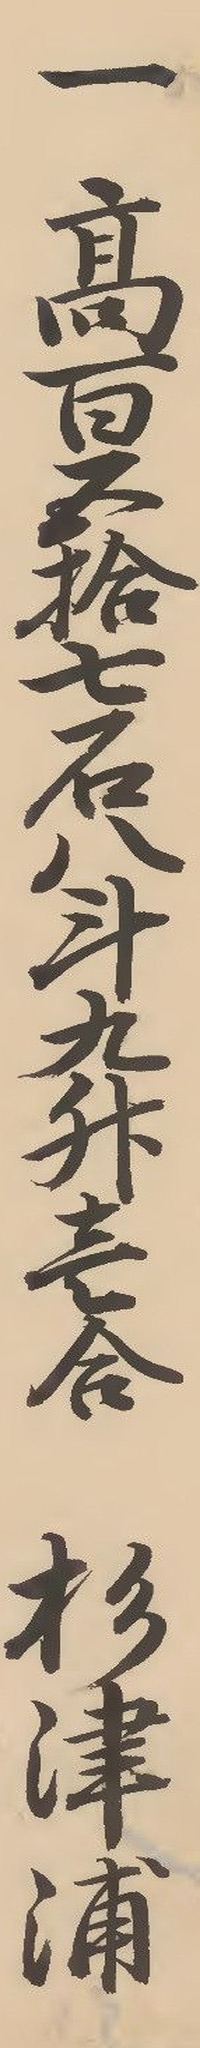一高百五拾七石八斗九升壱合杉津浦
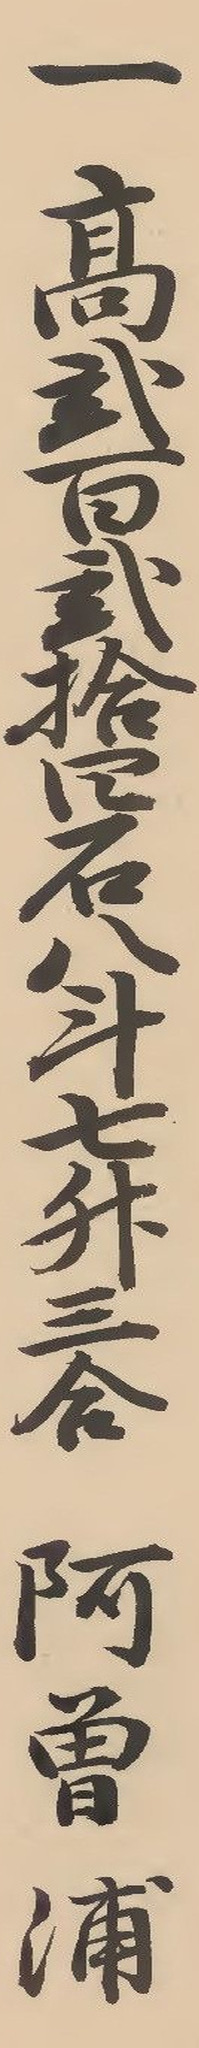一高弐百弐拾四石八斗七升三合阿曽浦
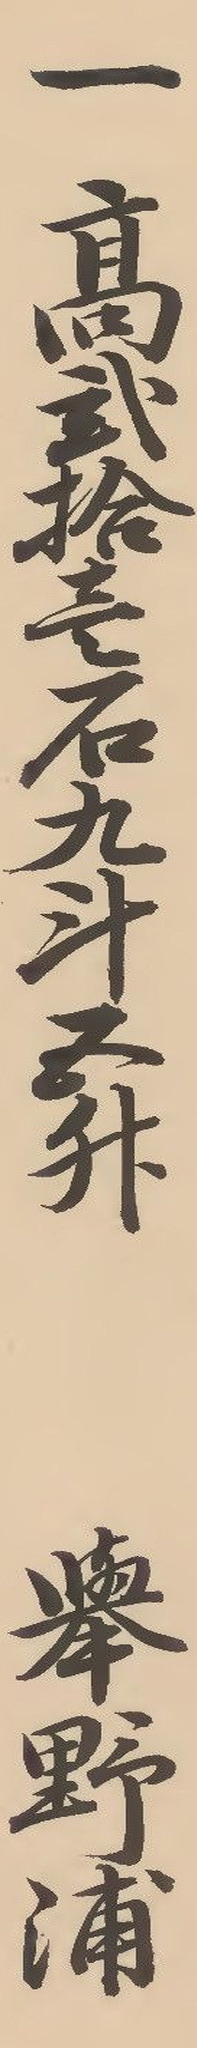一高弐拾壱石九斗五升挙野浦
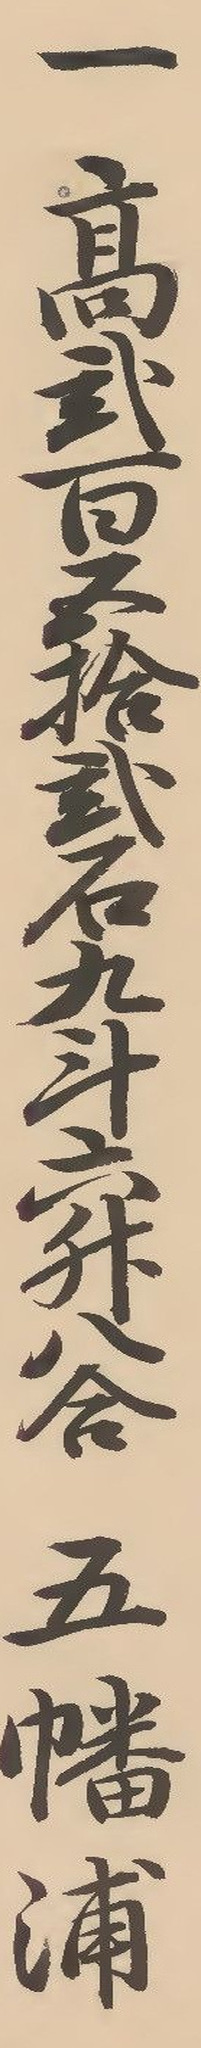一高弐百五拾弐石九斗六升八合五幡浦
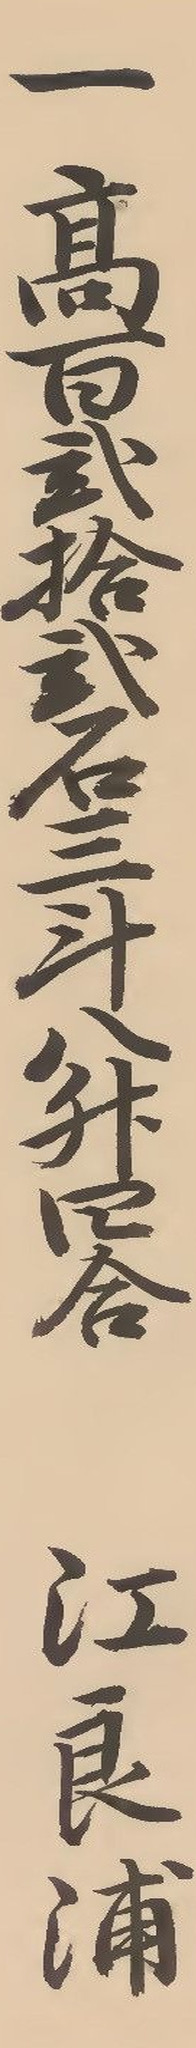一高百弐拾弐石三斗八升四合江良浦
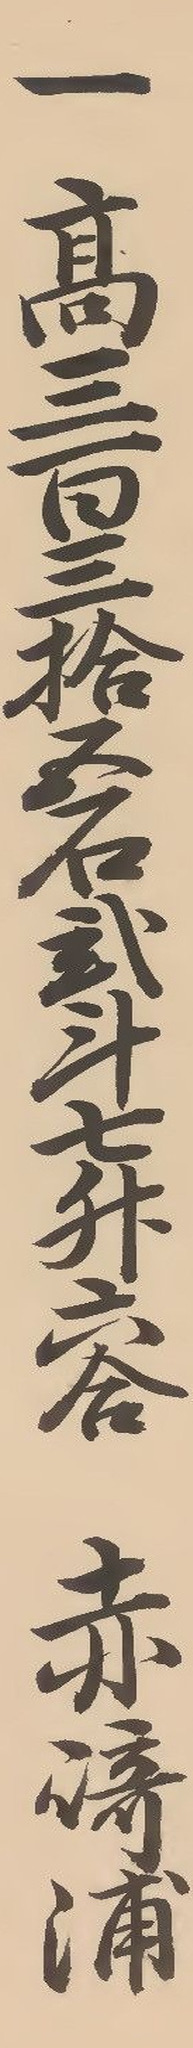一高三百三拾五石弐斗七升六合赤崎浦
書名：越前国郷帳
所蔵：国立公文書館 National Archives of Japan
